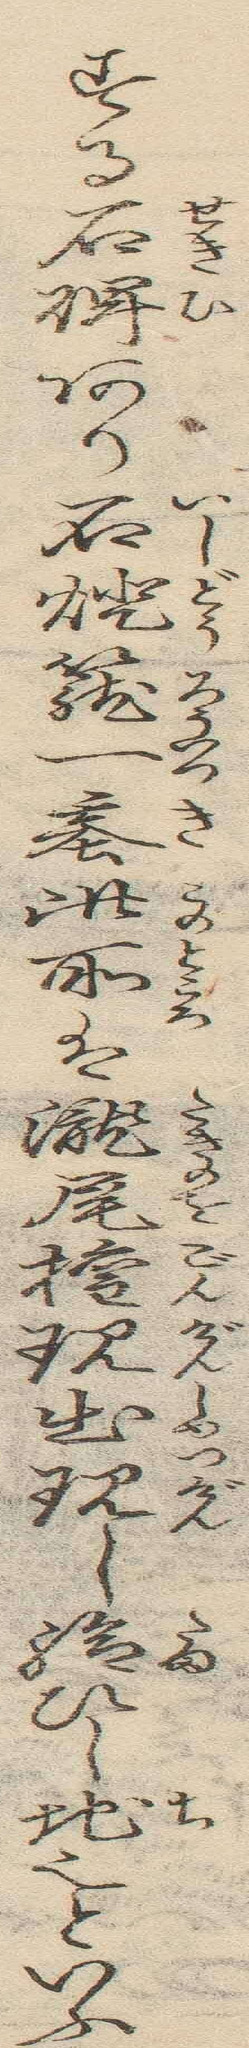する石碑あり石燈籠一基此所は瀧尾權現出現し給ひし地也といふ
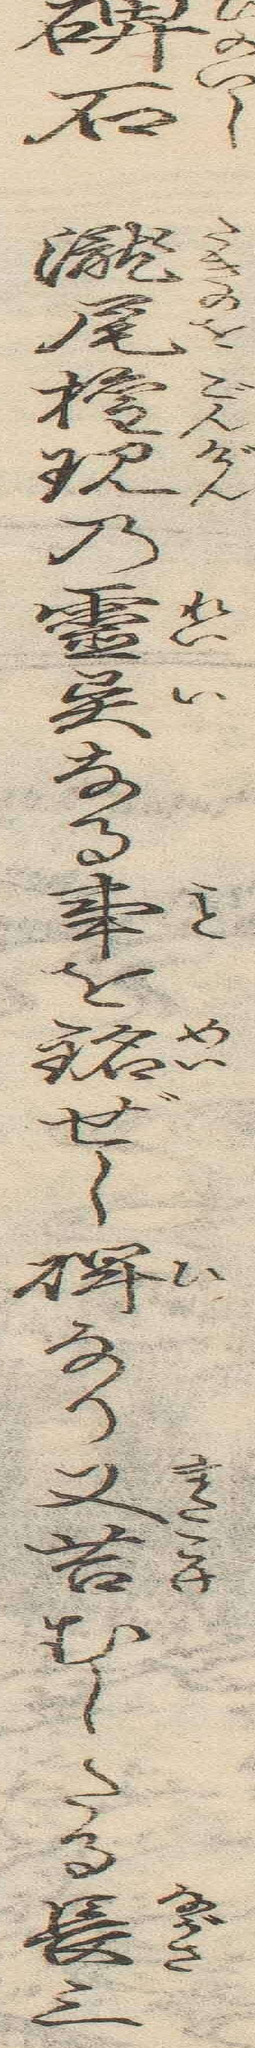碑石瀧尾權現の靈異なる事を銘ぜし碑なり又苔むしたる長三
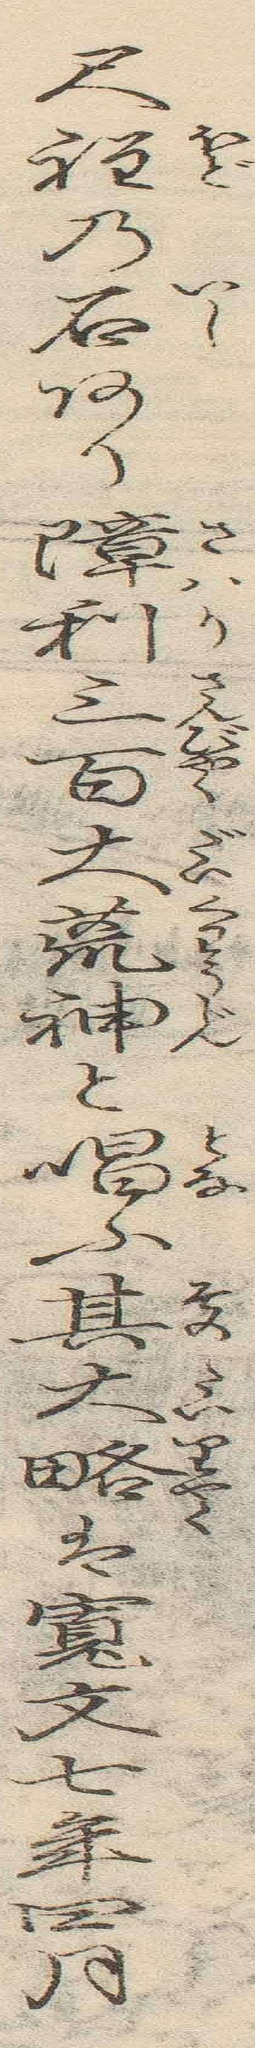尺程の石あり障利三百大荒神と唱ふ其大略は寬文七年四月
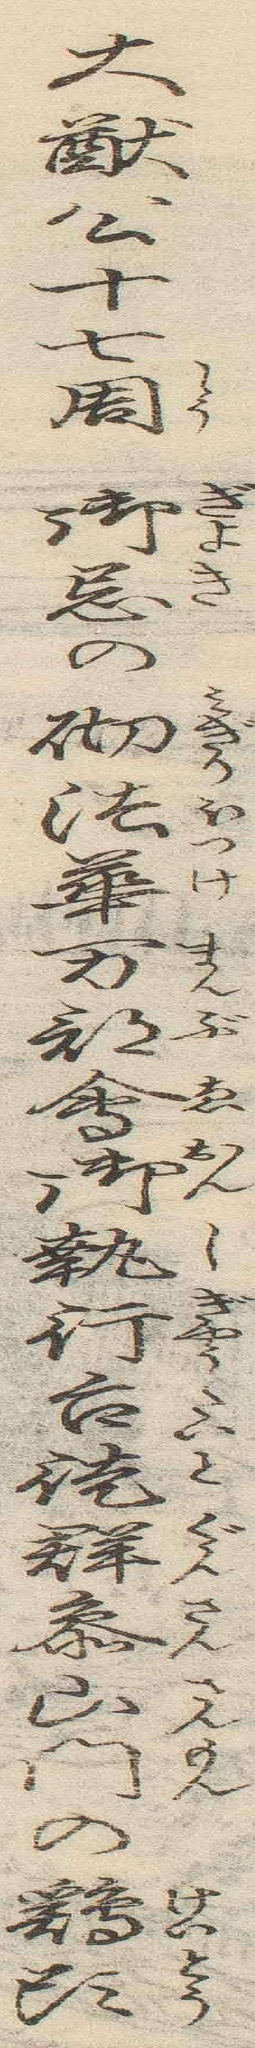大猷公十七周御忌の砌法華万部會御執行台徒群叅山門の鶏頭
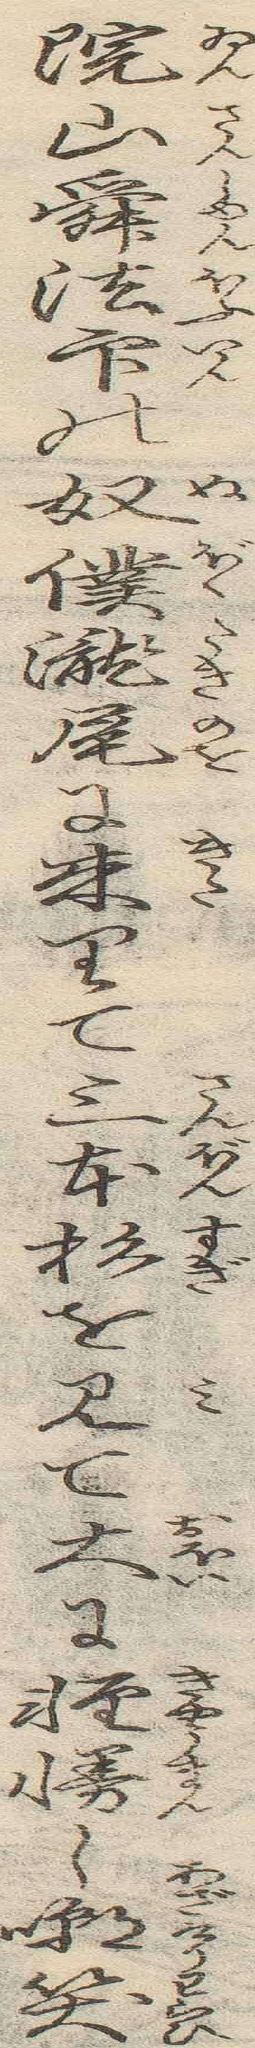院三舜法印の奴僕瀧尾に來りて三本杉を見て大に輕慢し嘲笑
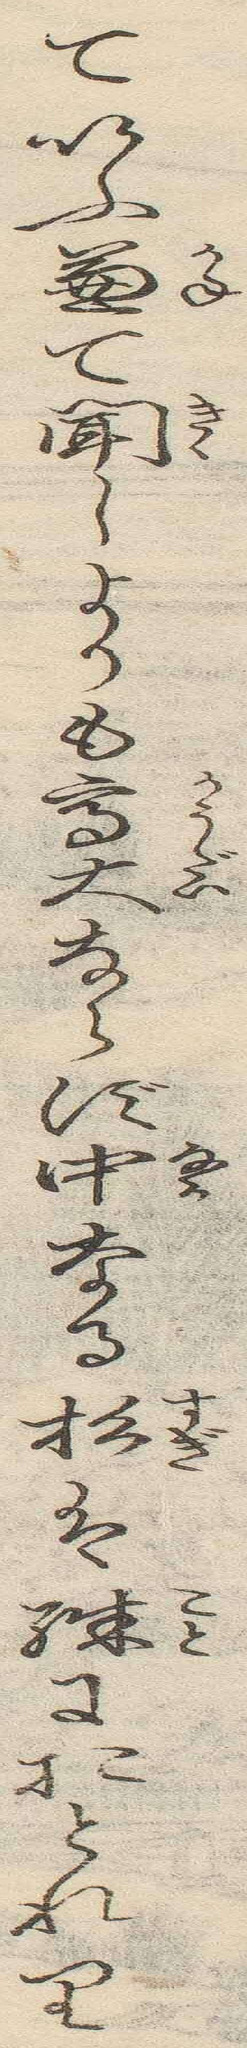ていふ兼て聞しよりも高大ならず中なる杉は殊におとれり
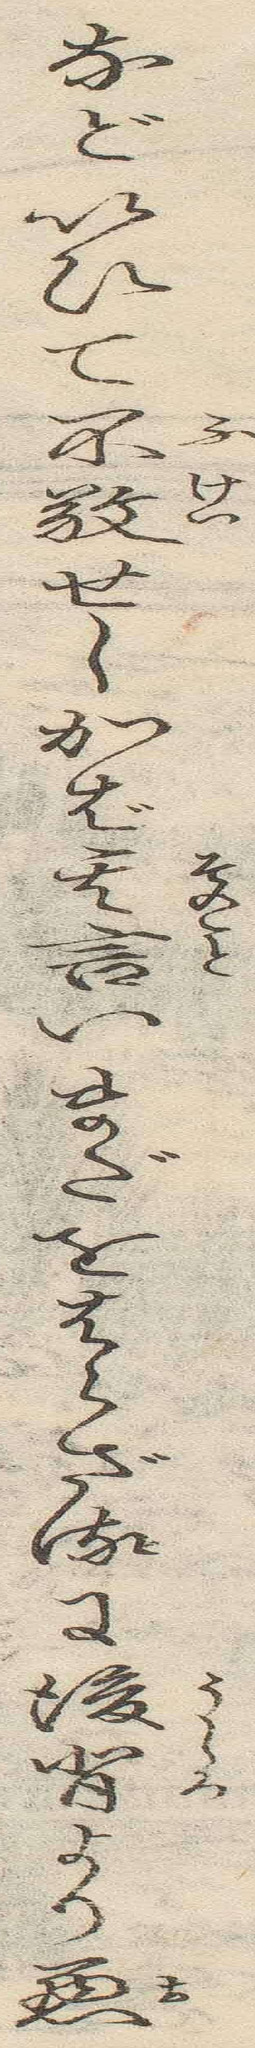などいひて不敬せしかば其言いまだをはらざるに後背より悪
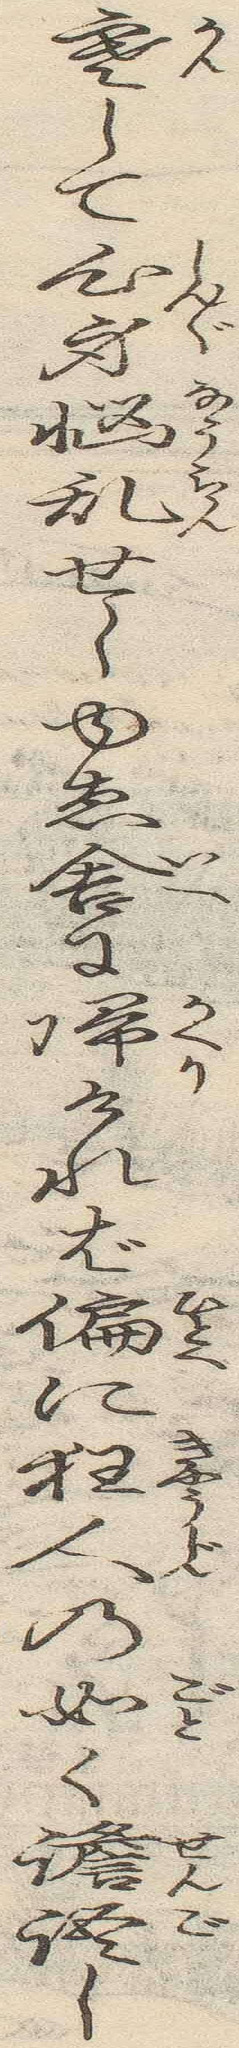寒して心身悩乱せしゆゑ舎に帰ければ偏に狂人の如く譫語し
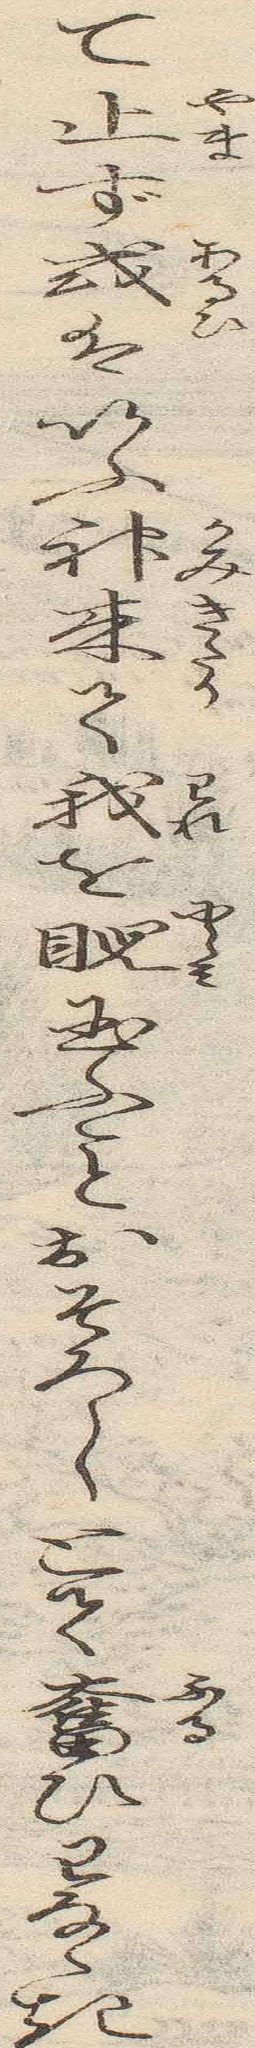て止ず或はいふ神來て我を睨玉ふことおそろしとて奮ひわなゝき
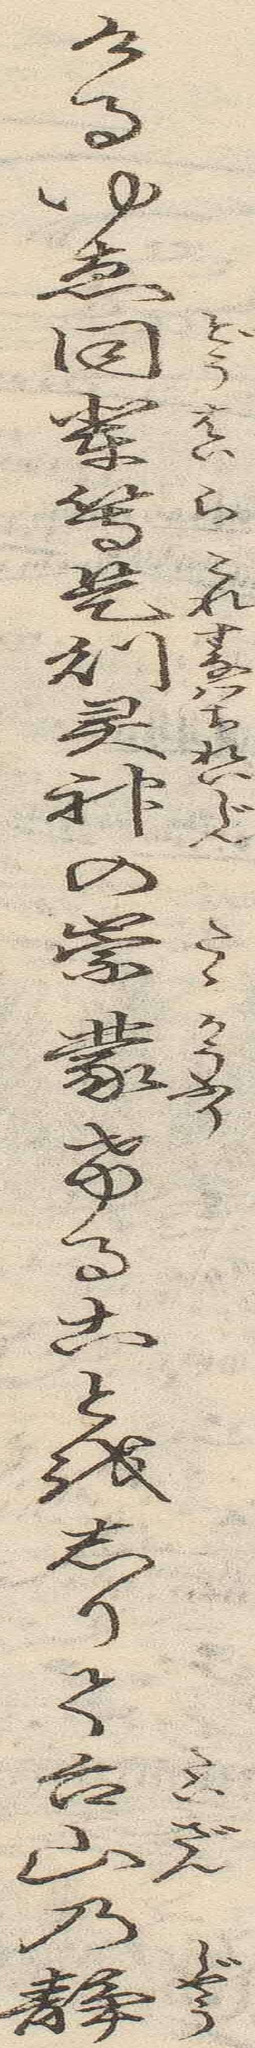けるゆゑ同輩等是則㚑神の祟蒙けることをしりて台山の静
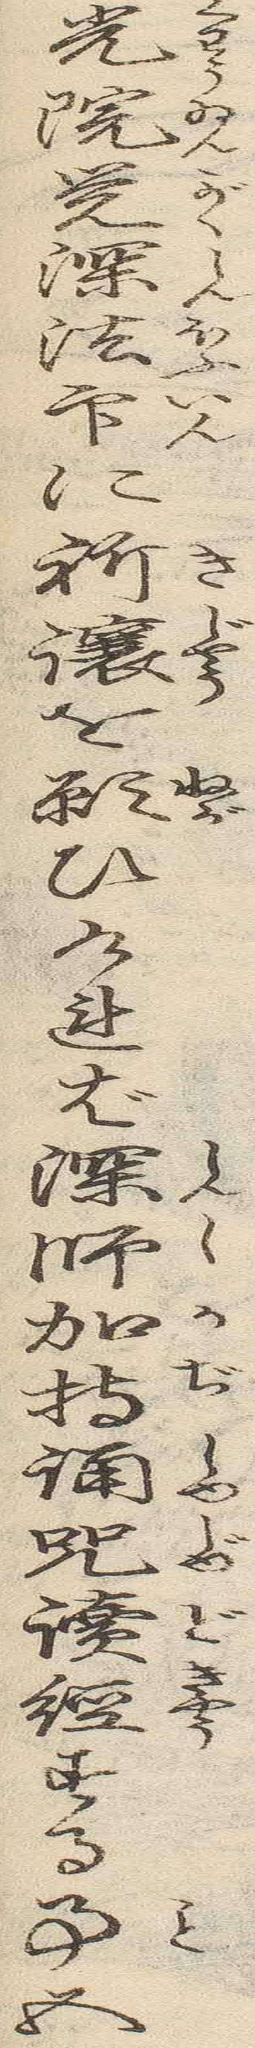光院覚深法印に祈讓を願ひければ深師加持誦咒讀經する事五
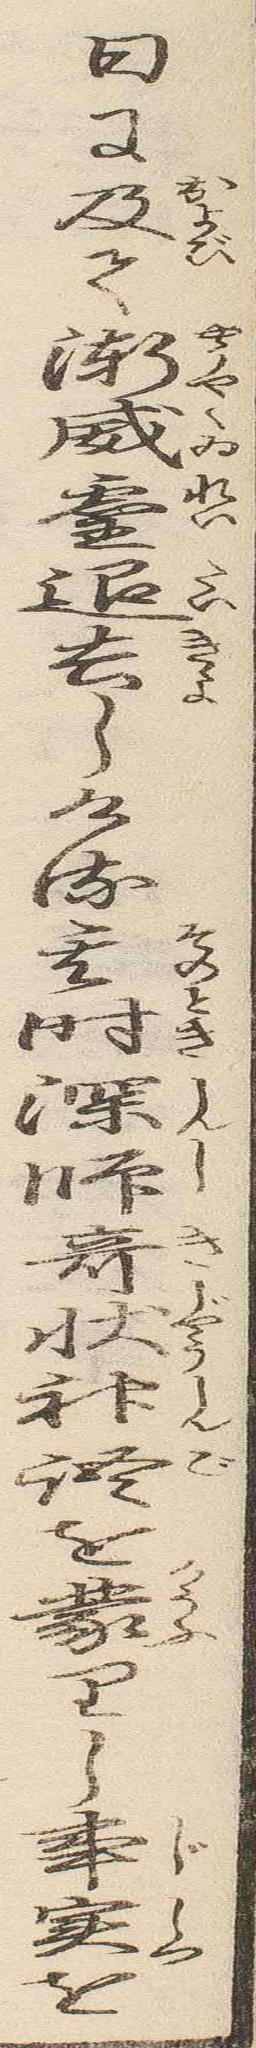日に及て漸威靈退去しける其时深師竒状神語を蒙りし事実を
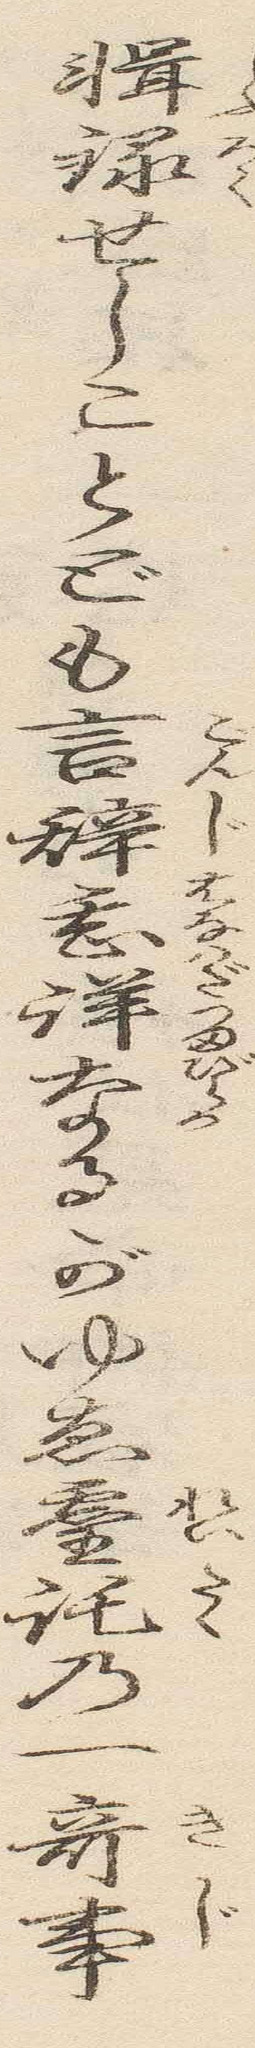輯録せしことども言辞甚詳なるがゆゑ靈詫の一竒事
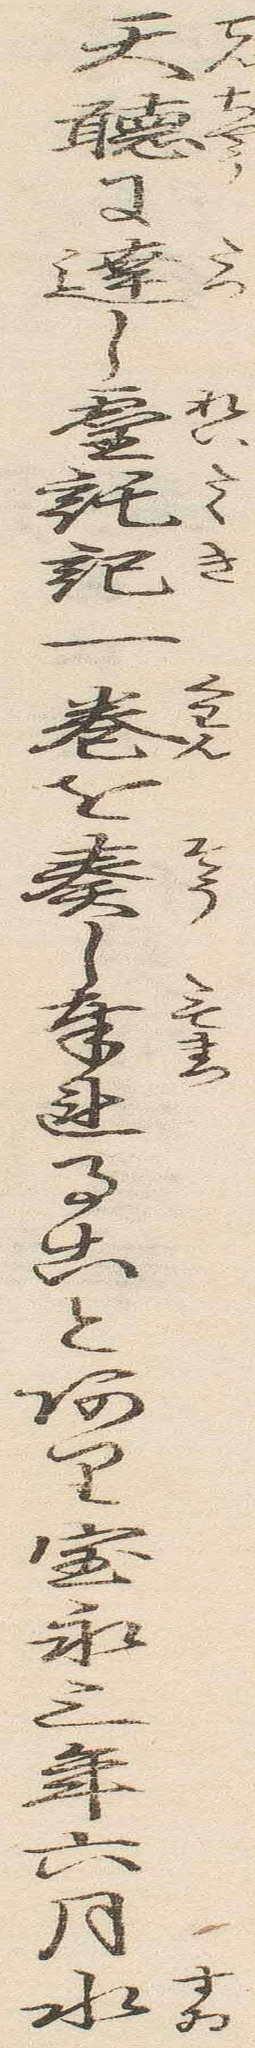天聽に達し靈詫記一巻を奏し奉れることあり宝永三年六月水
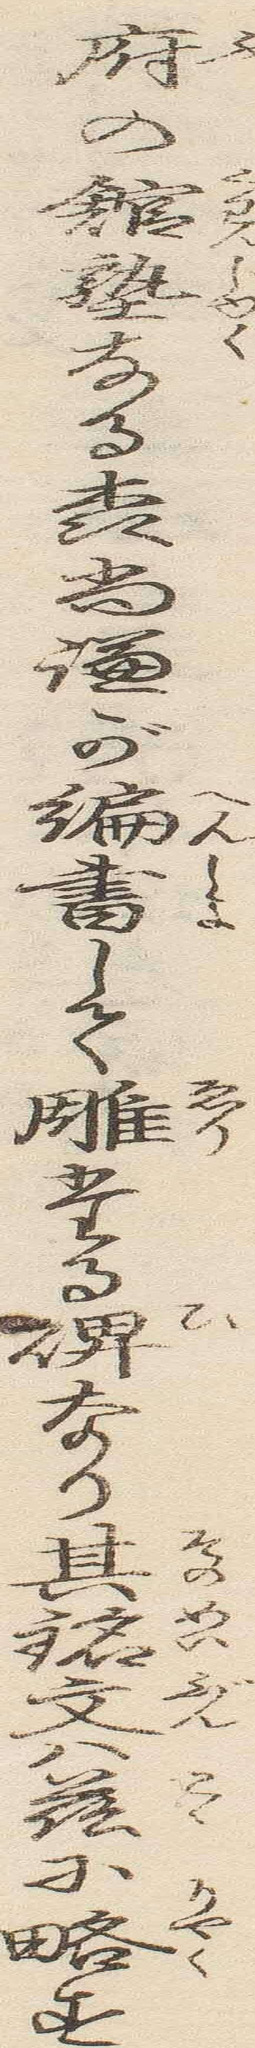府の舘塾なる森尚論が編諸して雕たる碑なり其銘文は爰に略す
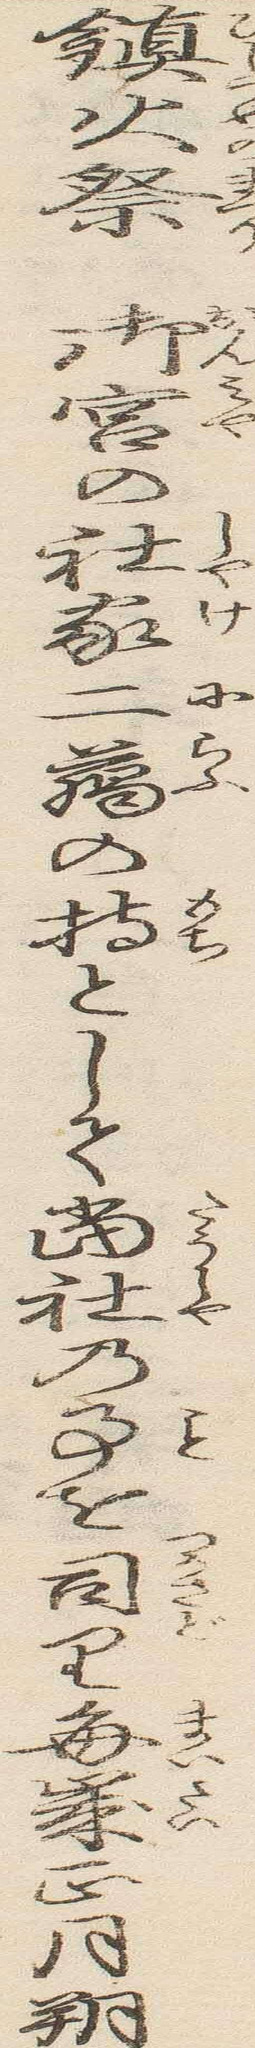鎭火祭御宮の社家二﨟の持として當社の事を司り毎歳正月朔
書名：日光山志
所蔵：東京学芸大学附属図書館 国文学研究資料館
